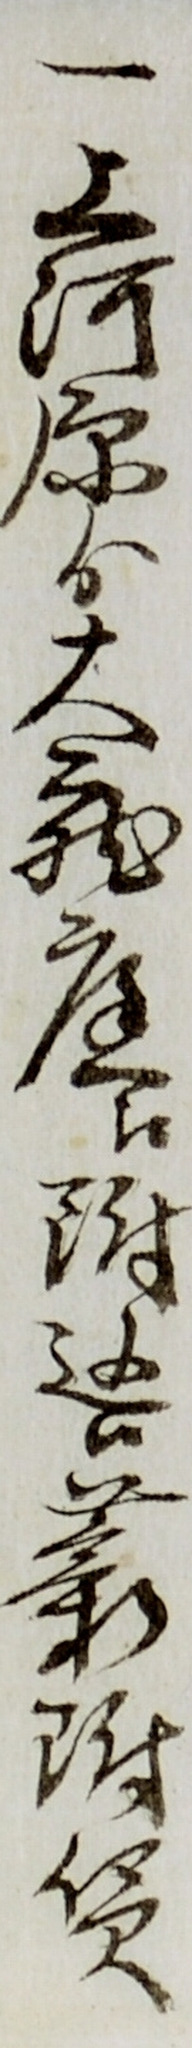一上河原ゟ大蔵庭え附込候薪附賃
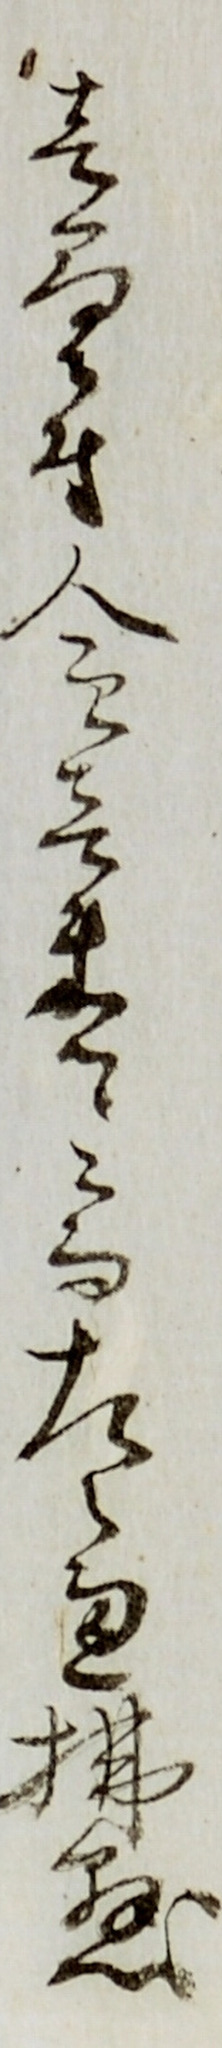壱間に付金壱朱ツヽにて左之通払懸
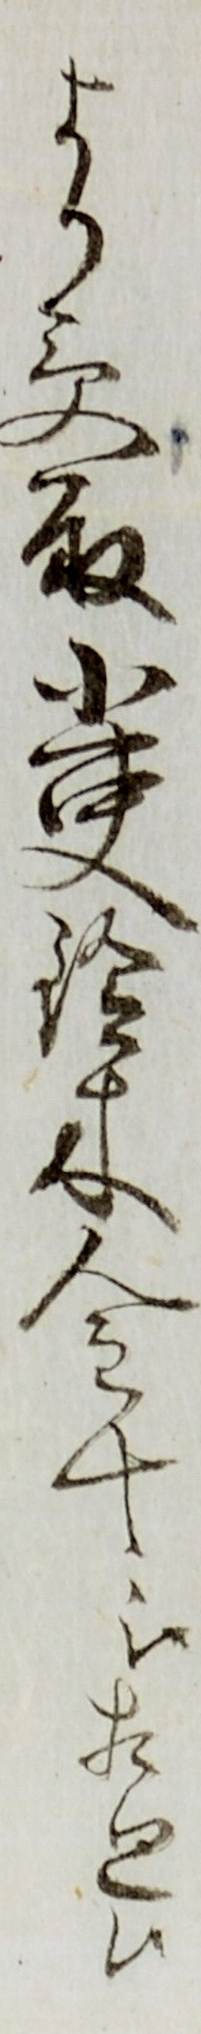より受取小吏鈴木金十え相廻候
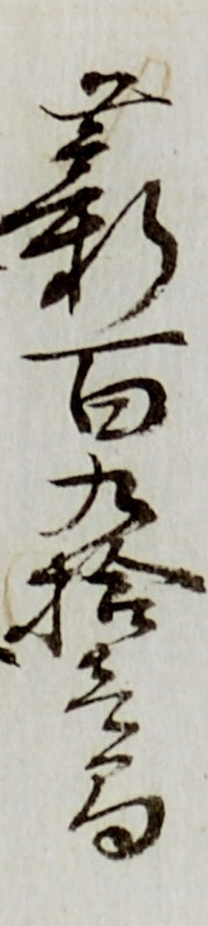薪百九拾壱間
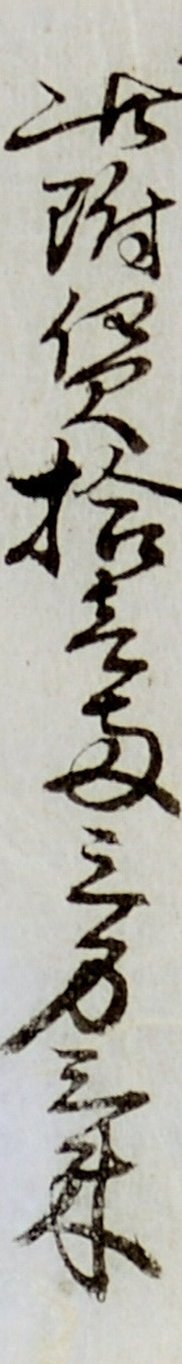此附賃拾壱両三分三朱
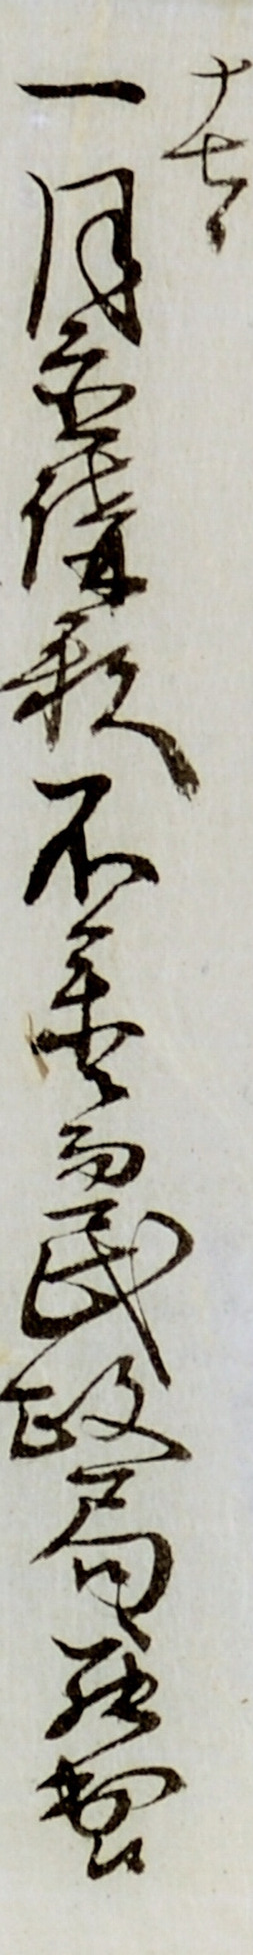一月並講釈不参にて民政局へ罷出候
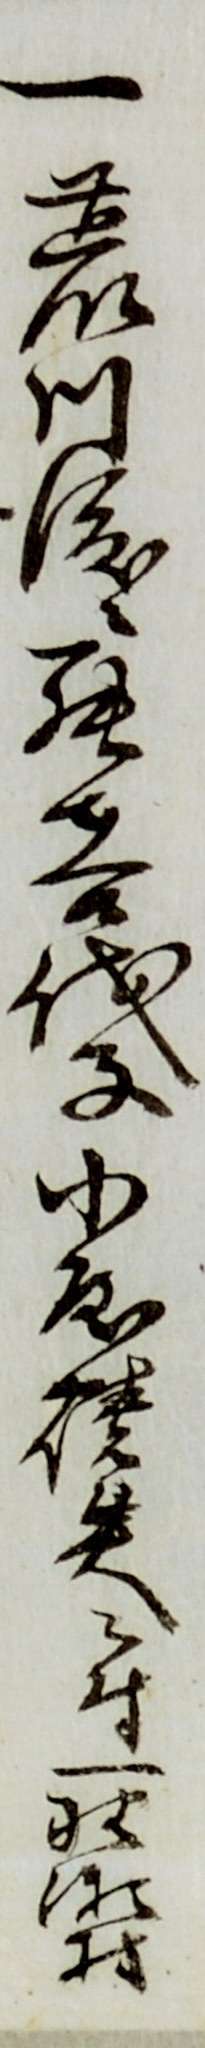一荒川渡に罷在候伐子小屋焼失に付市野瀬村
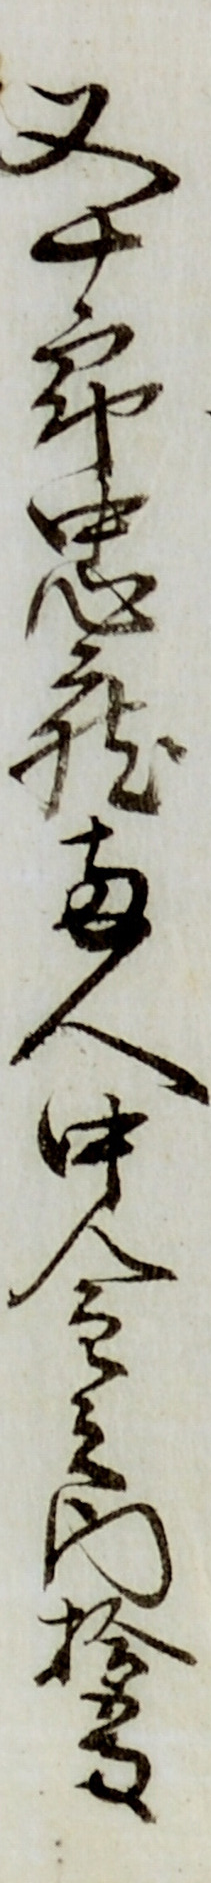又十郎忠蔵両人中金之内拾五両
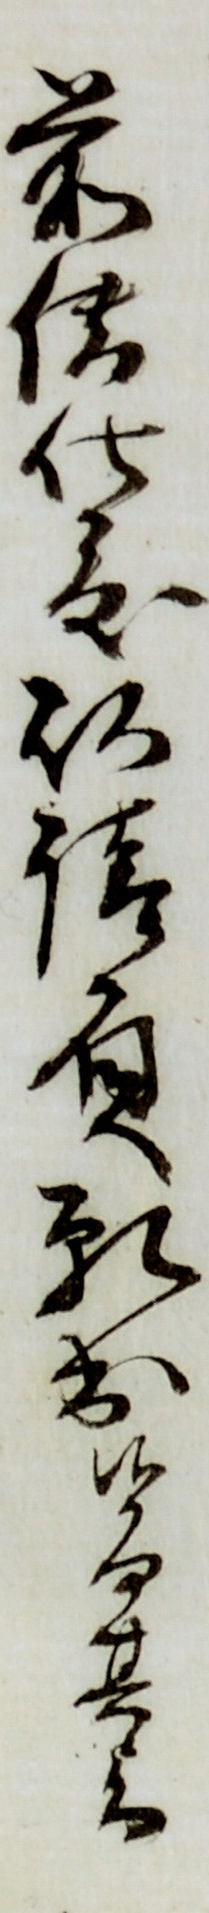前借仕度以請負願出候間其旨
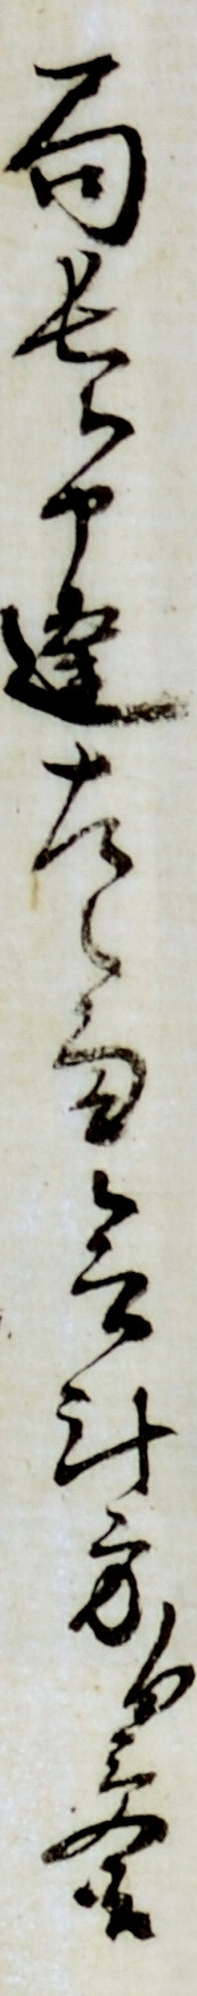局長え申達左之通会計方ゟ受取

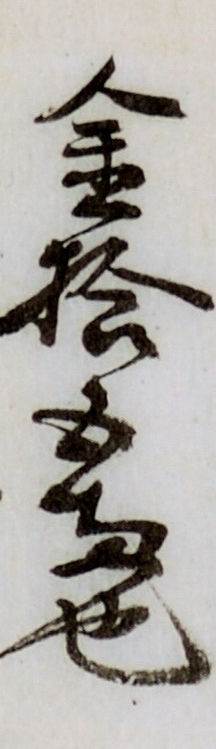金拾五両也
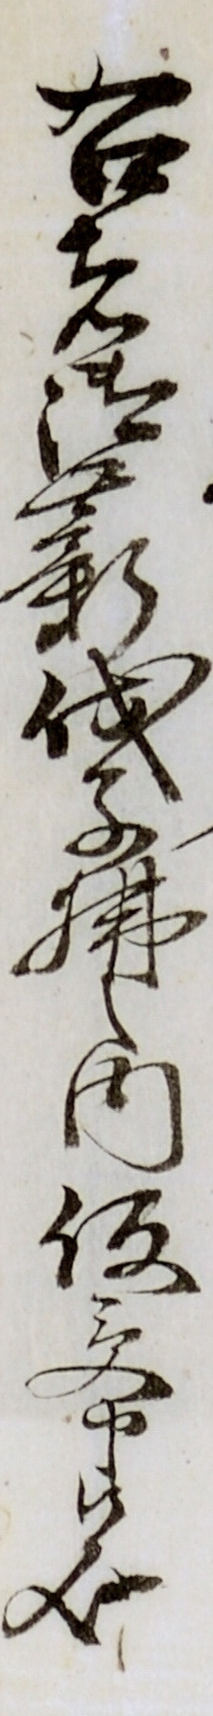右は御薪伐子払之内仮受申候処
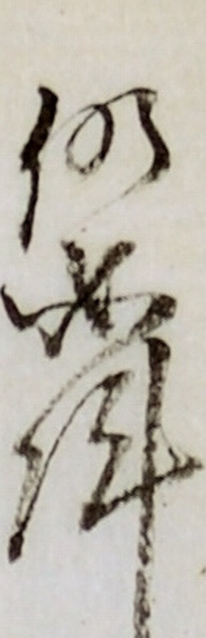仍如件
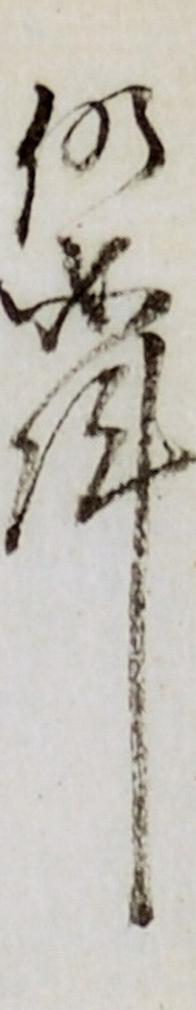仍如件
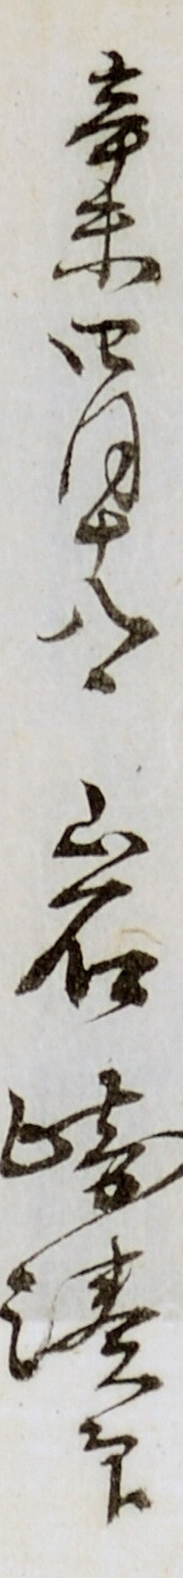辛未四月十八日岩崎湊印
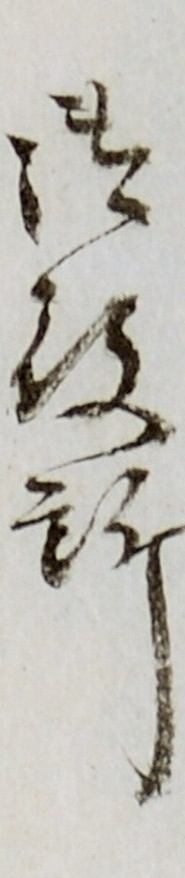御役所
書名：山林方諸事御用留
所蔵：伊那市立高遠町図書館・合同会社AMANE
